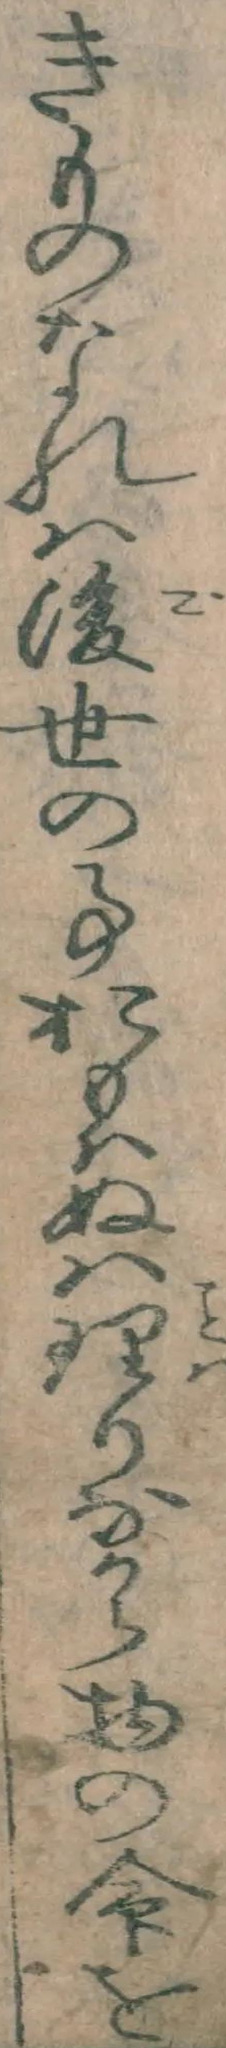きものなれは後世の事おもはぬは理りなから物の命を

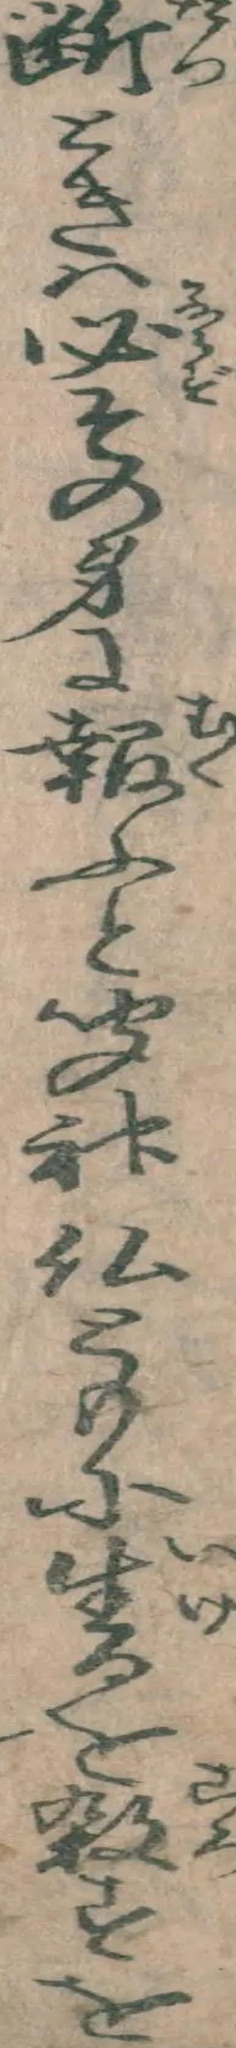断ときは必その身に報ふと神仏ともに生るを殺すを
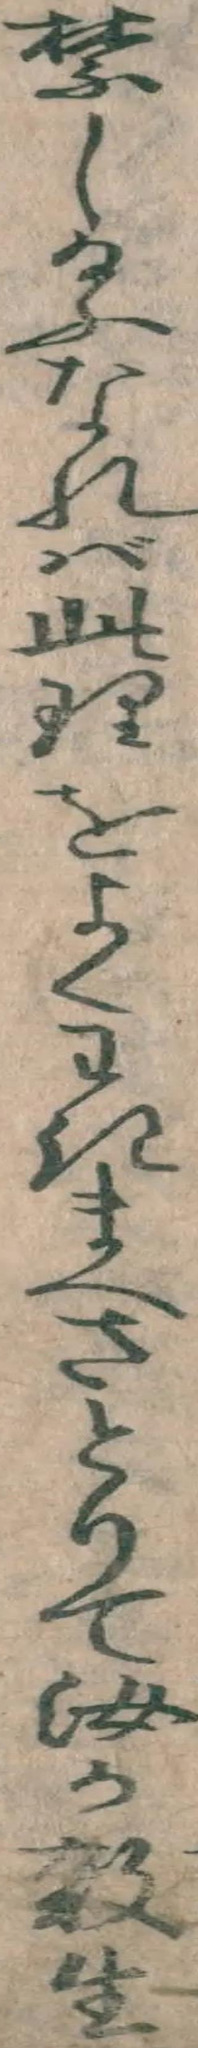禁し給ふなれば此理をよくわきまへさとりて汝か殺生
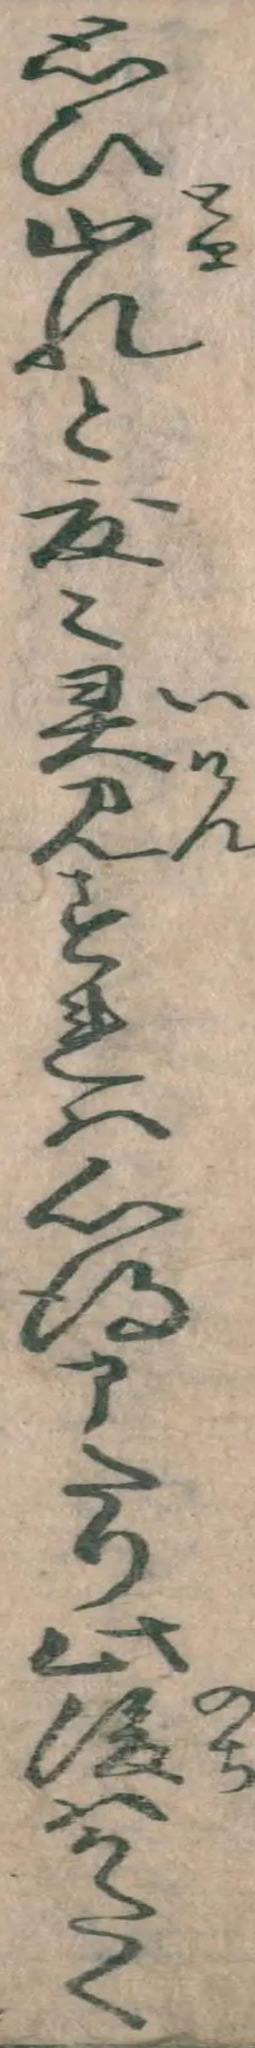思ひ止れと度々異見すれは心得申たり此後はかたく
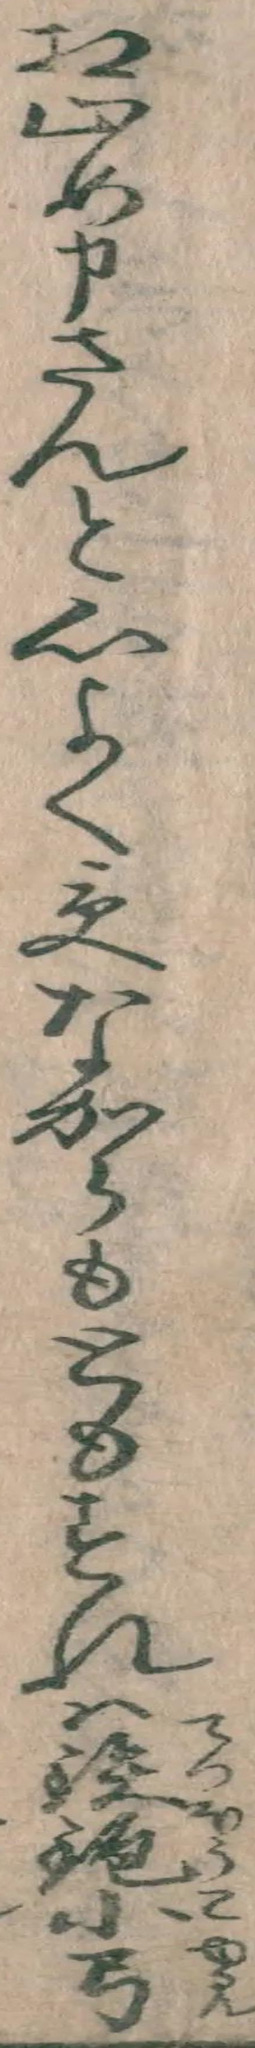相止め申さんと心よく受なからもともすれは鉄砲小弓
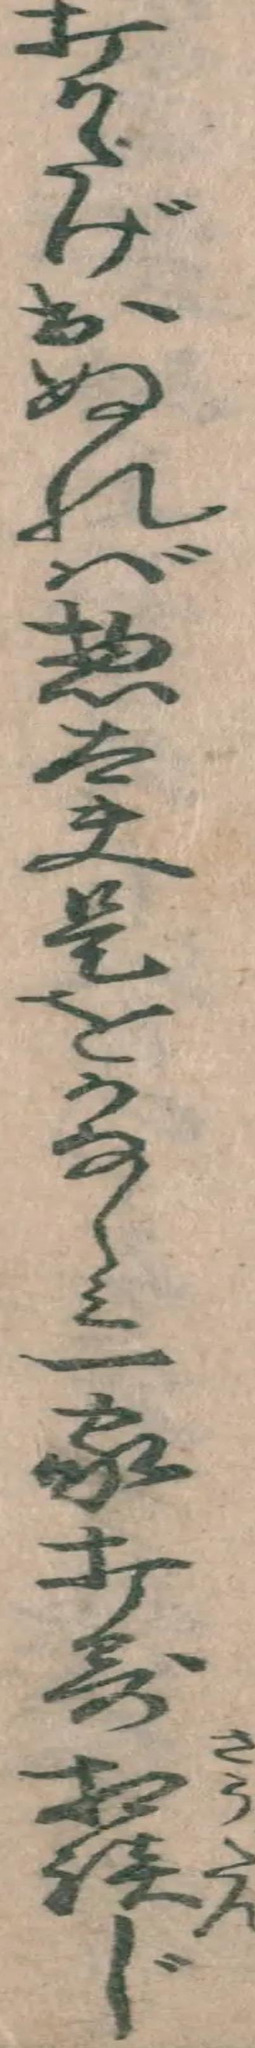打かたげ出ぬれば惣太夫是をかなしみ一家打寄相談じ
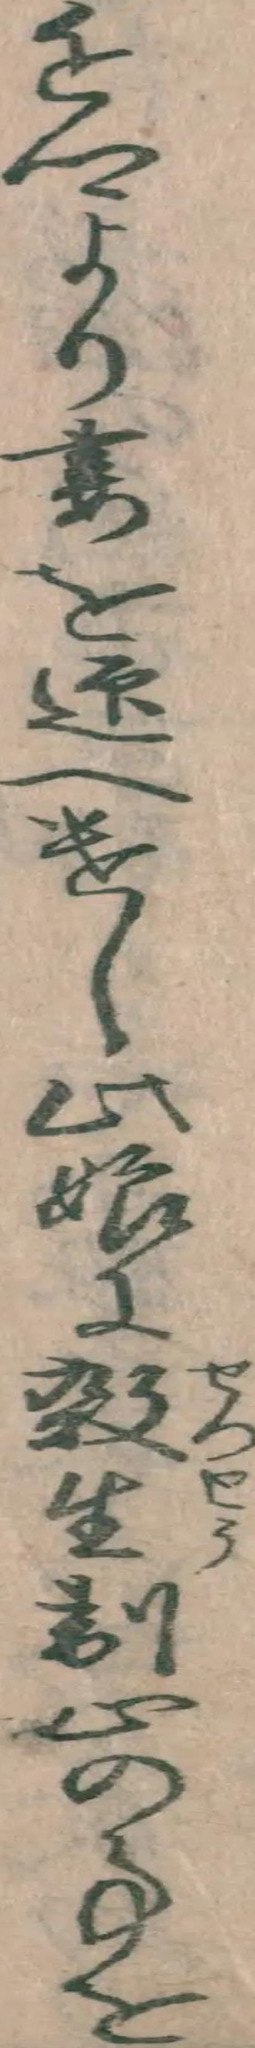近郷より妻を迎へ遣し此娘に殺生制止の事を
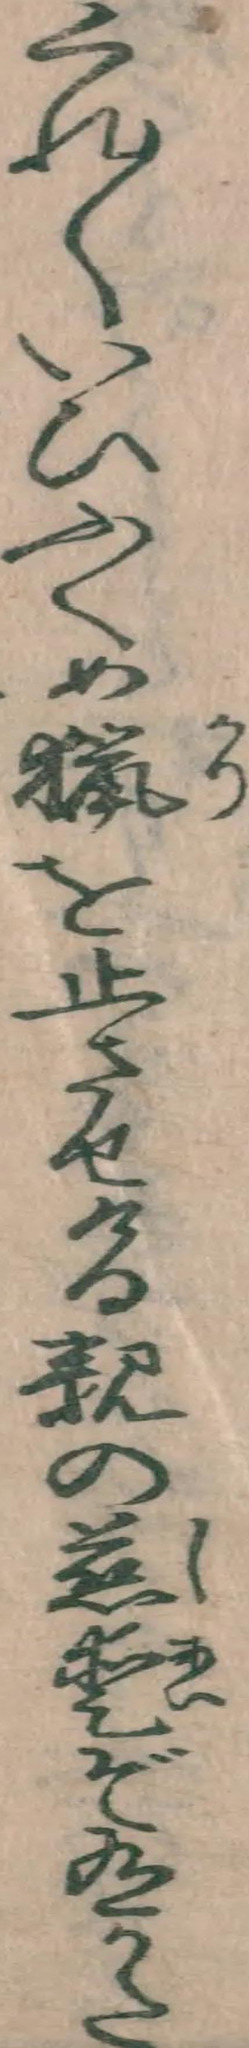くれ〳〵もいひふくめ猟を止させける親の慈愛ぞ有かた
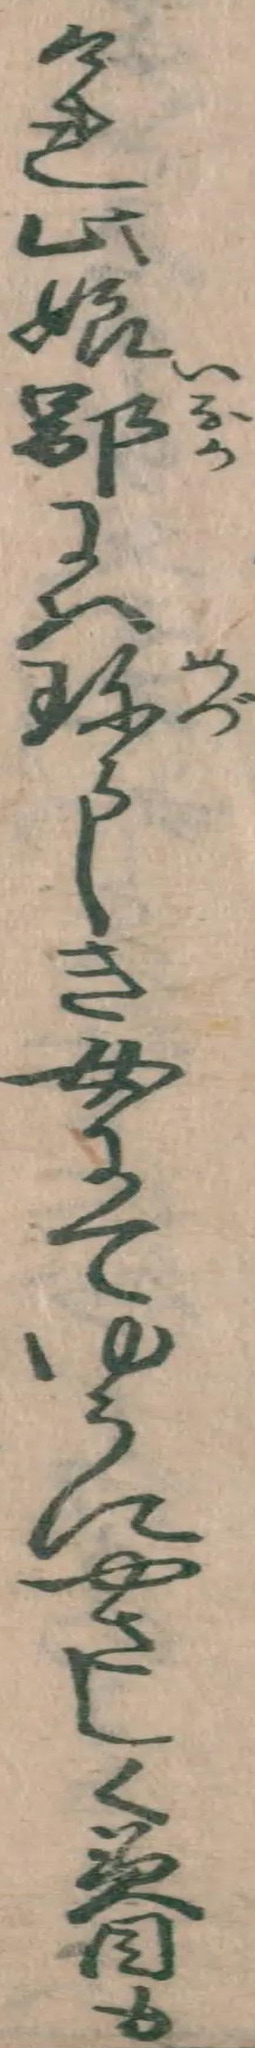けれ此娘鄙には珍らしき女にてゆうにやさしく美目も
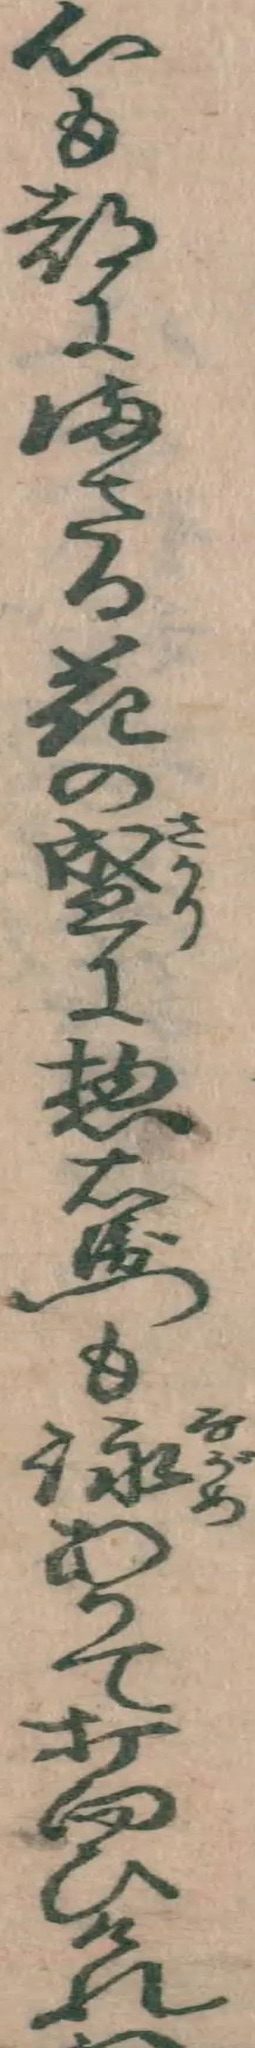心も都にまさる花の盛に惣右衛門も詠ありて打向ひけれは
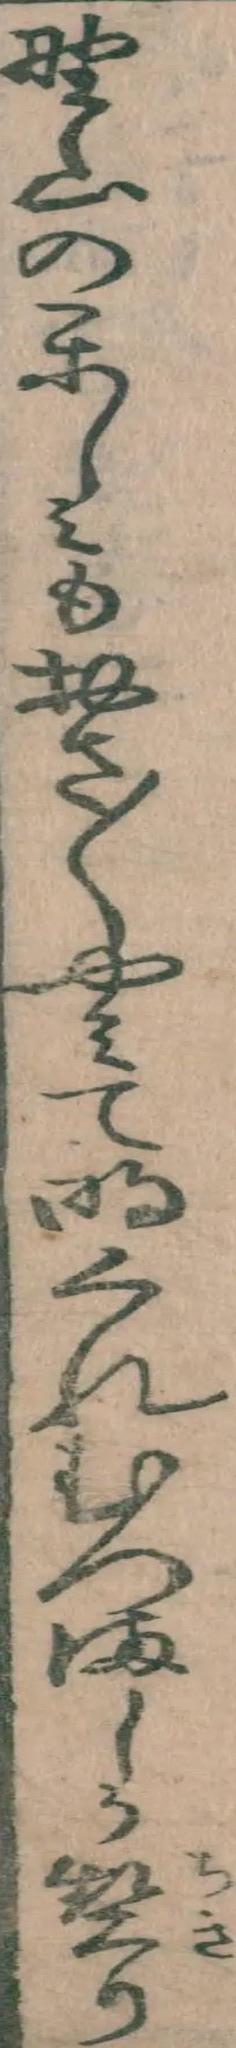野山の楽しみもおさ〳〵やみて明くれむつましう契り
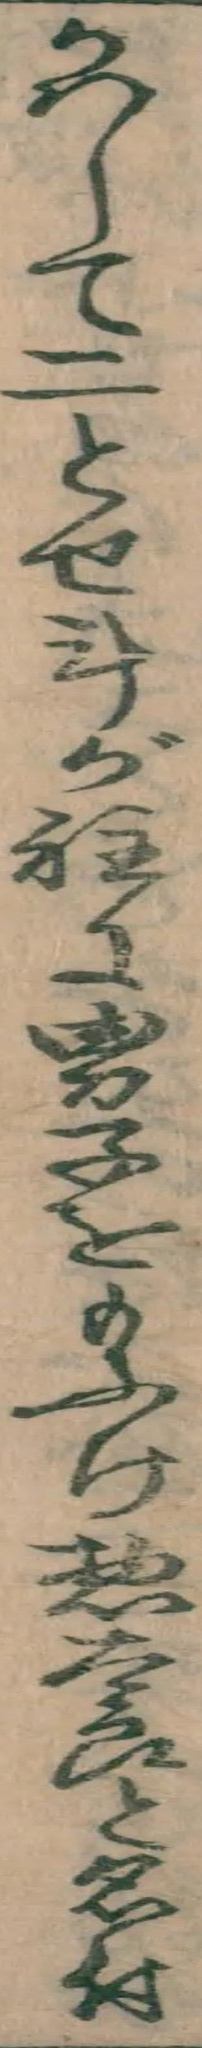かはして二とせ斗が程に男子をもふけ惣太郎と名付
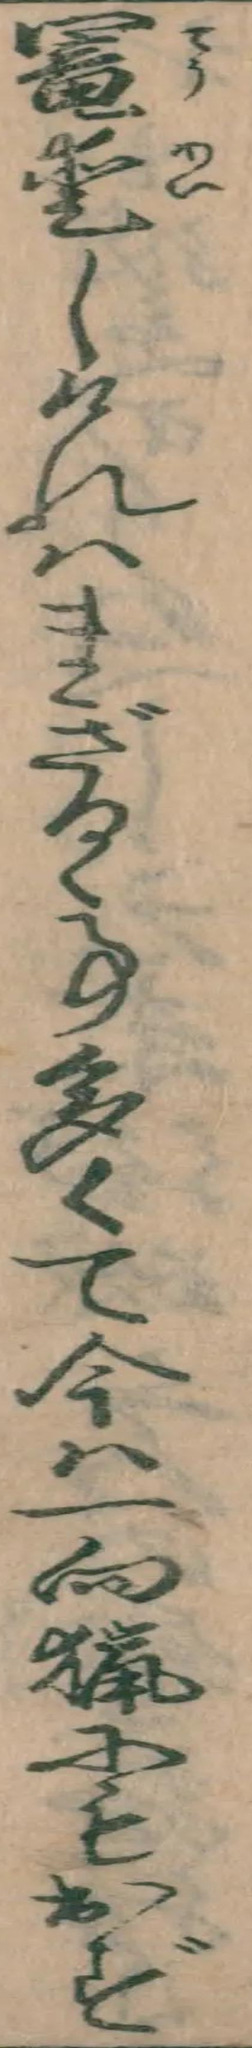寵愛しけれはまぎるゝ事多くて今は一向猟にも出ず
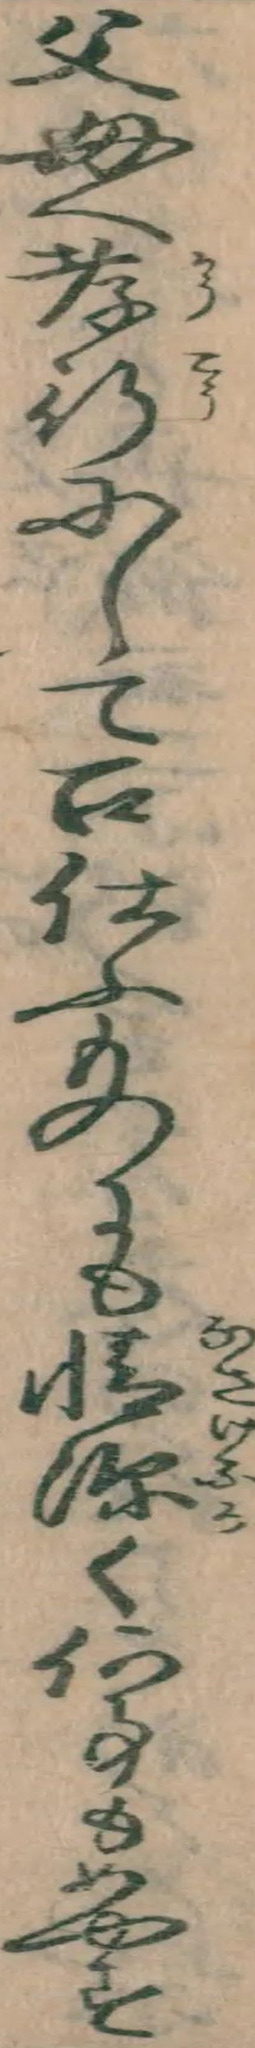父母へ孝行にして召仕ふものにも情深く何事もめやす
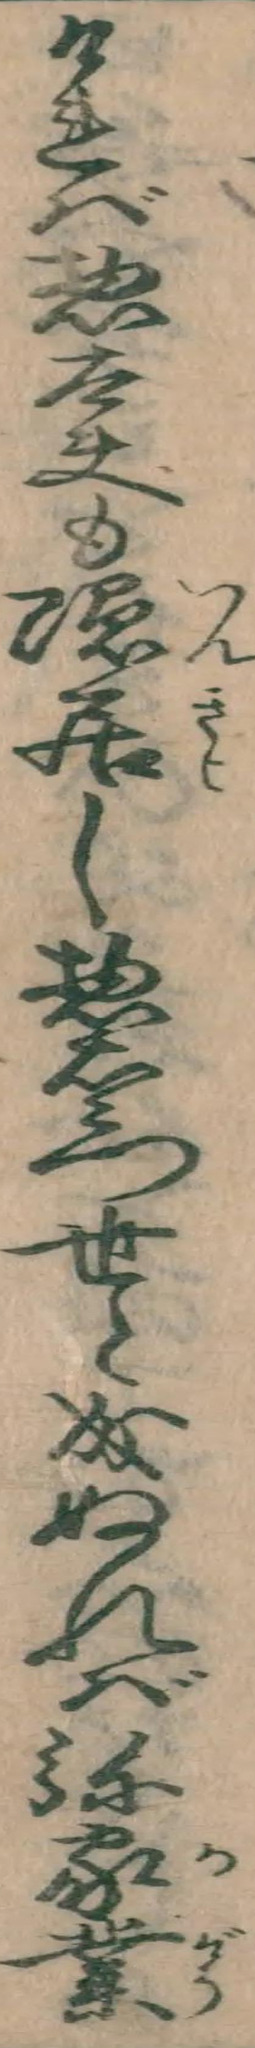ければ惣太夫も隠居し惣右衛門世と成ぬれば弥家業
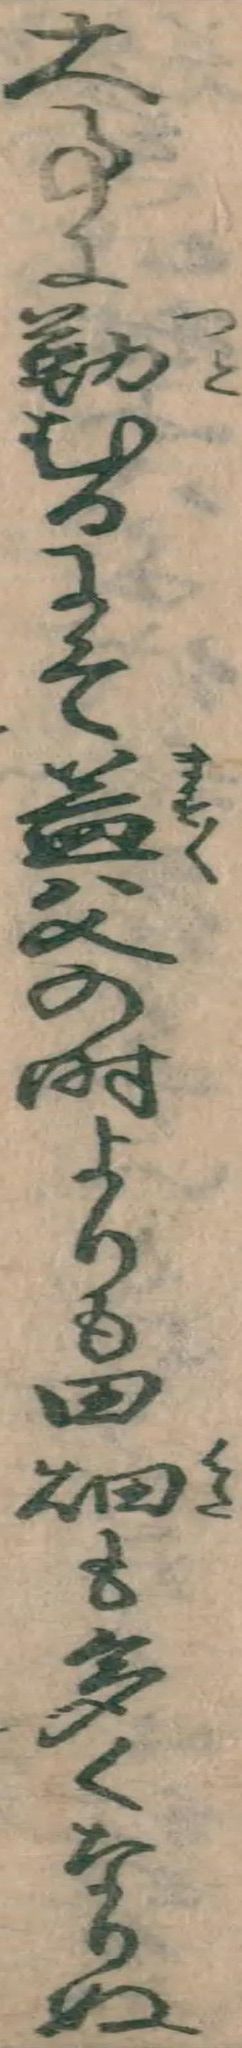大事に勤むるにて益父の時よりも田畑も多くなりぬ
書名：怪談御伽童 5巻. [1]
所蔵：国立国会図書館 National Diet Library, JAPAN
